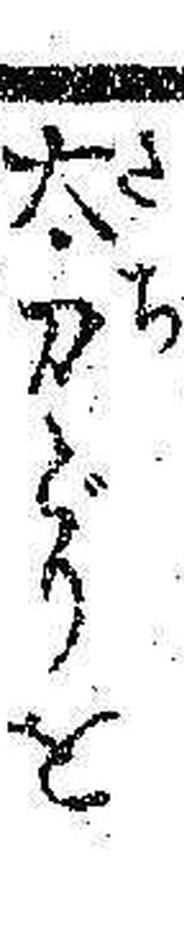太刀どりを
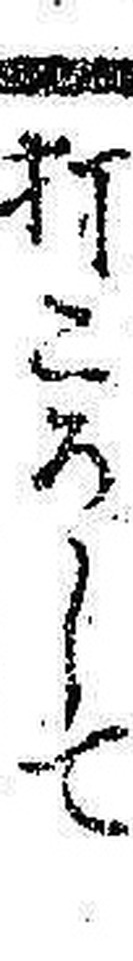打ころして
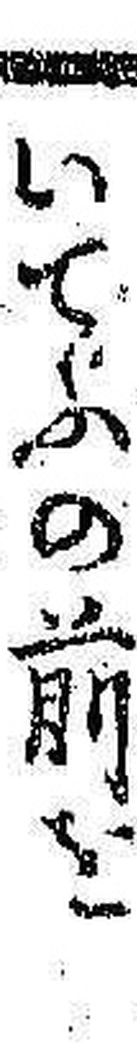いてふの前を
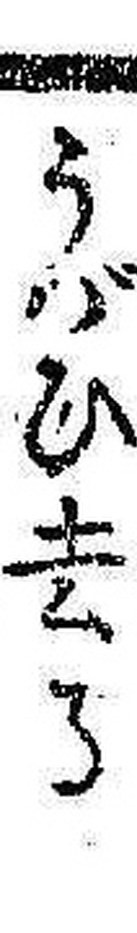うばひ去る

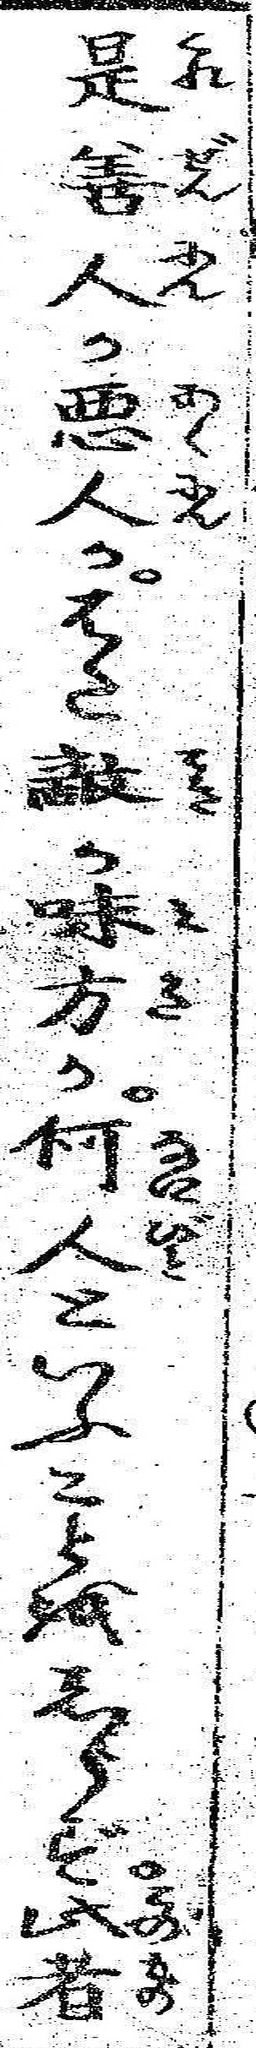是善人か悪人か。はた敵か味方か。何人といふことをしらず。此者
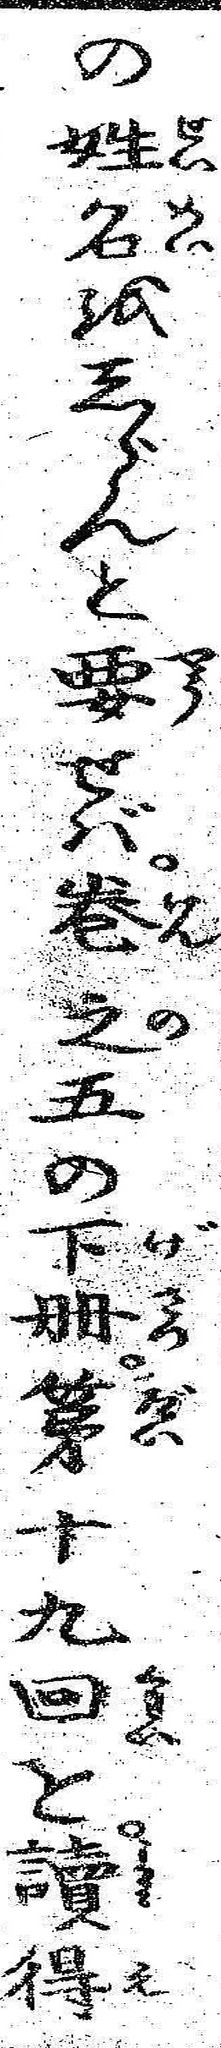の姓名をしらんと要せば。巻之五の下冊。第十九回を。読得
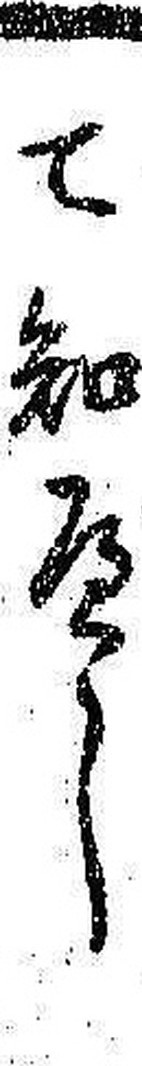て知べし
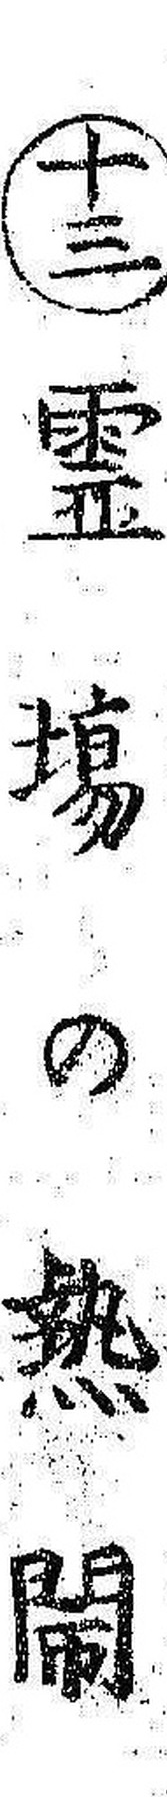十三霊場の熱閙
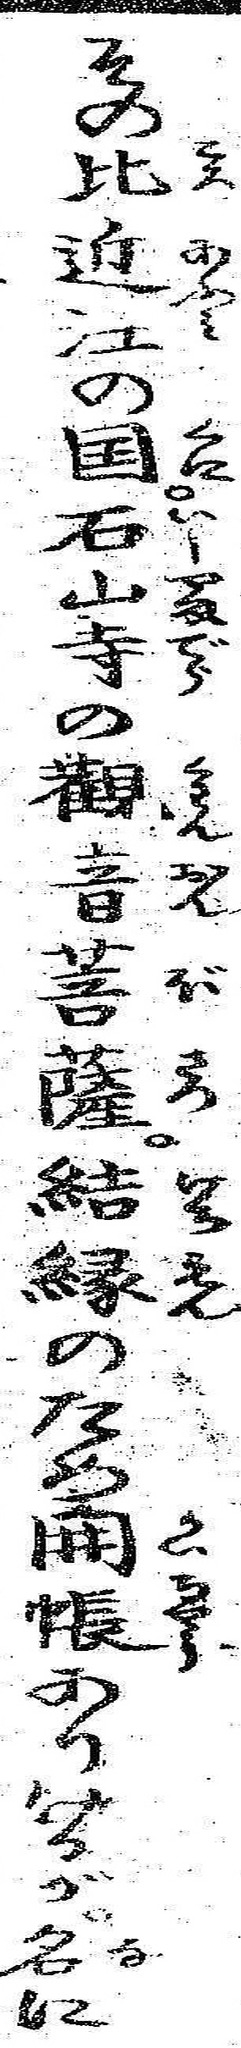その比近江の国。石山寺の観音菩薩。結縁のため開帳ありけるが。名に
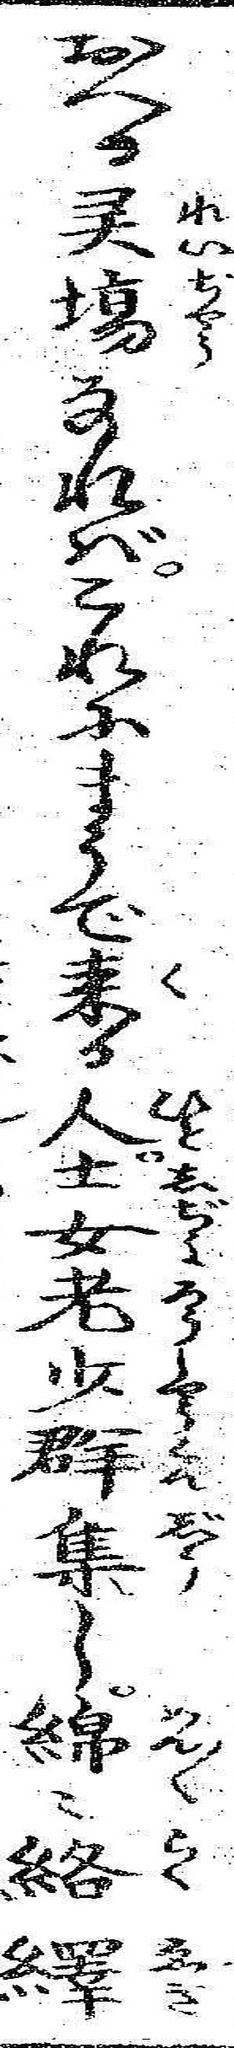おへる霊場なれば。これにまうで来る人。士女老少群集し。綿々絡繹
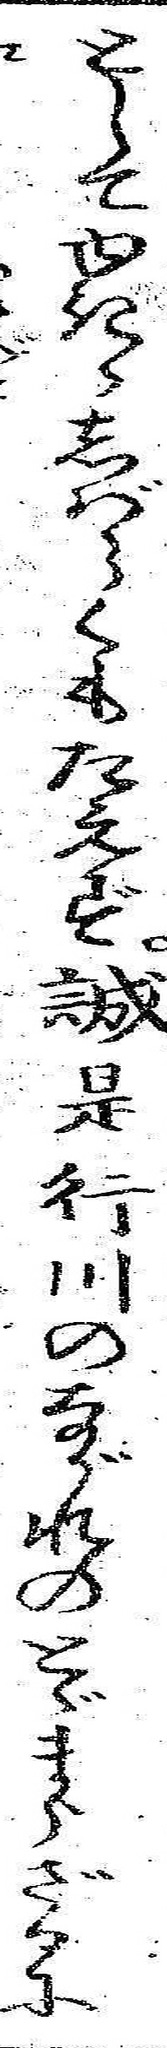としてゆきゝしばらくもたえず。誠是行川のながれのとゞまらざるに
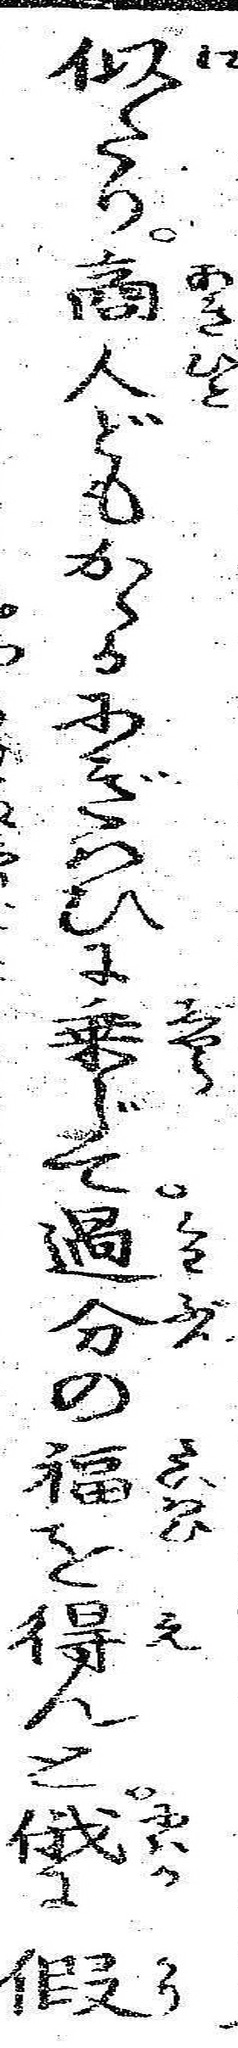似たり。商人どもかゝるにぎはひに乗じて。過分の福を得んと。俄に仮
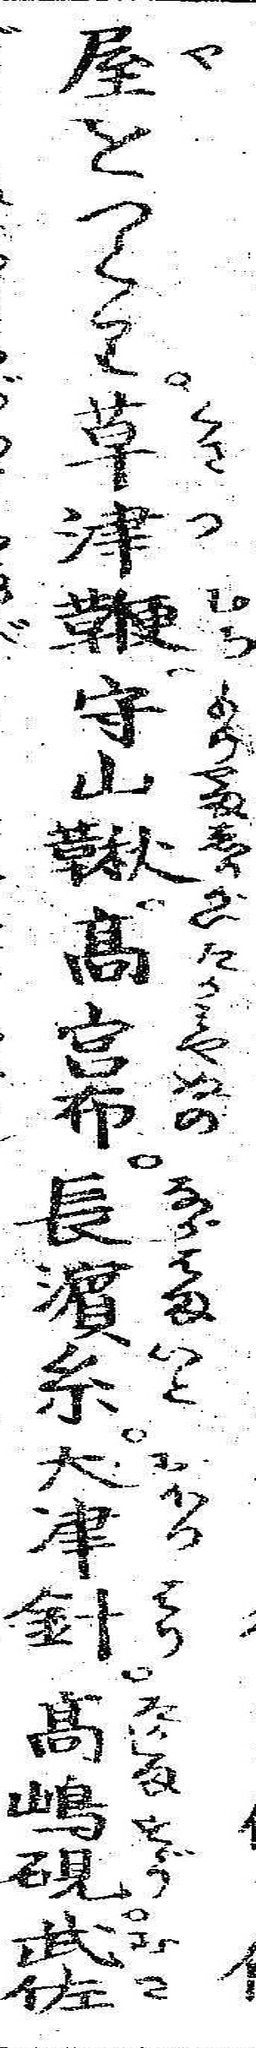屋をつくり。草津鞭。守山鞦。高宮布。長浜糸。大津針。高島硯。武佐
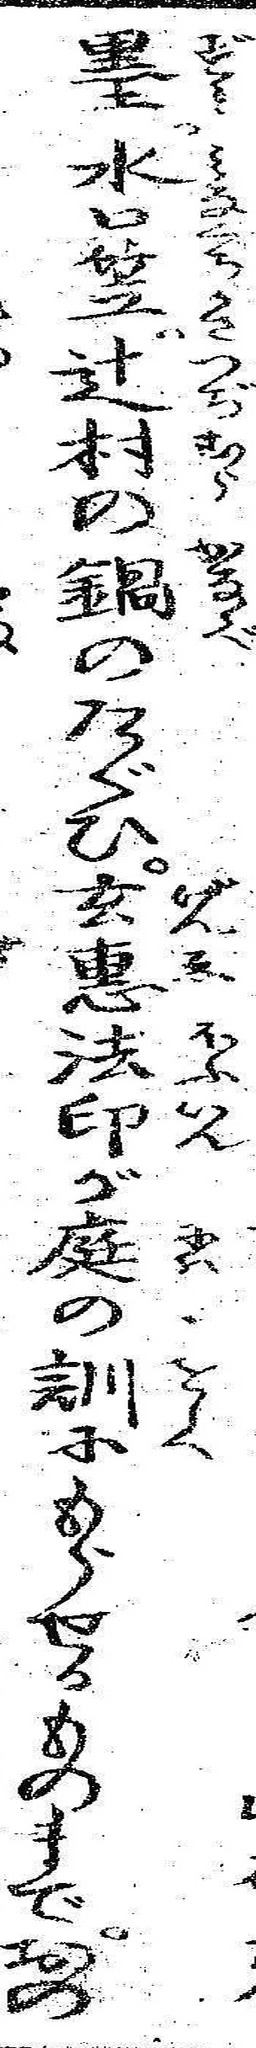墨。水口笠。辻村の鍋のたぐひ。玄恵法印が庭の訓にもらせるものまで。おの
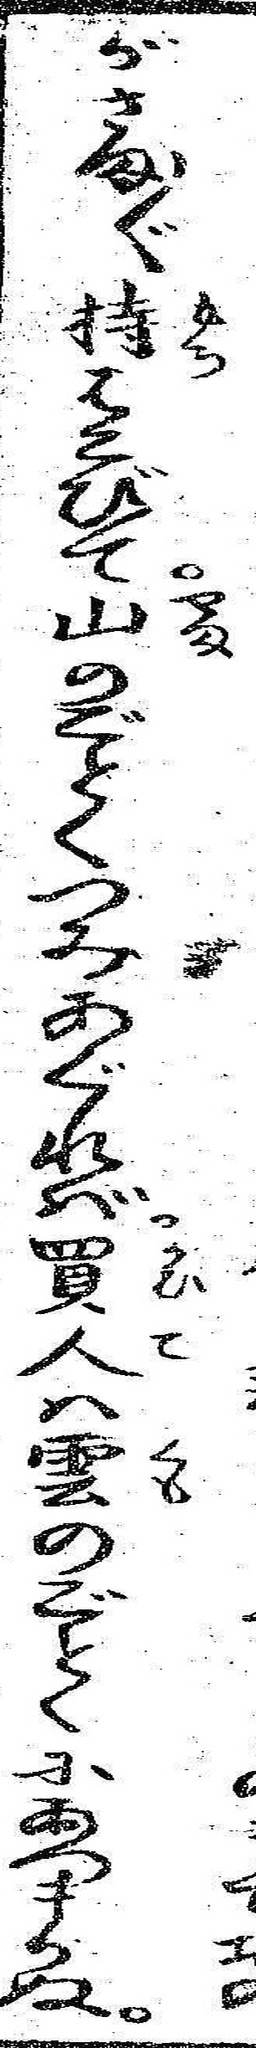がさま〴〵持はこびて。山のごとくつみあぐれば。買人は雲のごとくにあつまりぬ。
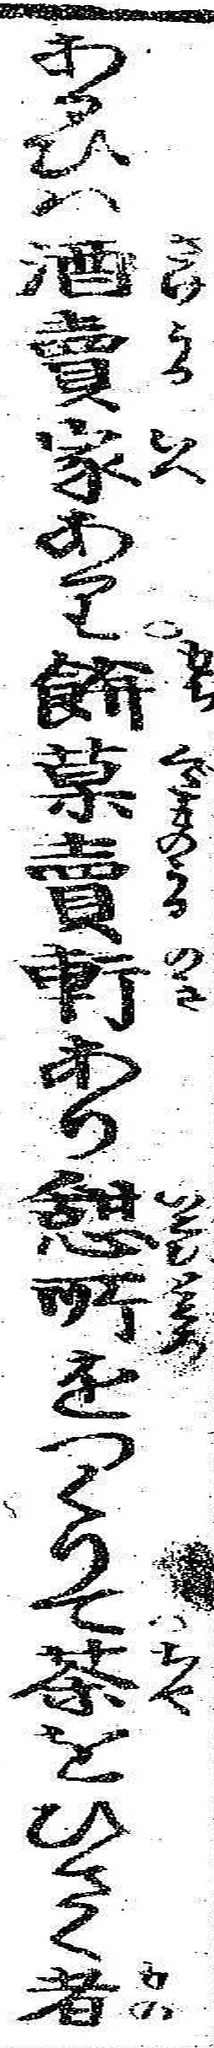あるひは酒売家あり。餅菓売軒あり憩所をつくりて。茶をひさく者
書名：昔話稲妻表紙
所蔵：国文学研究資料館
